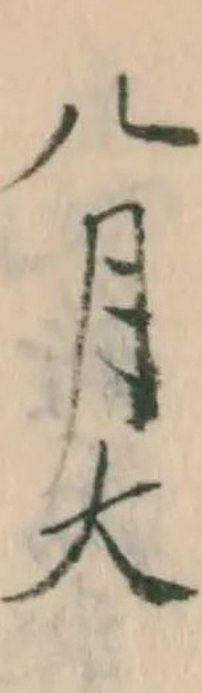八月大
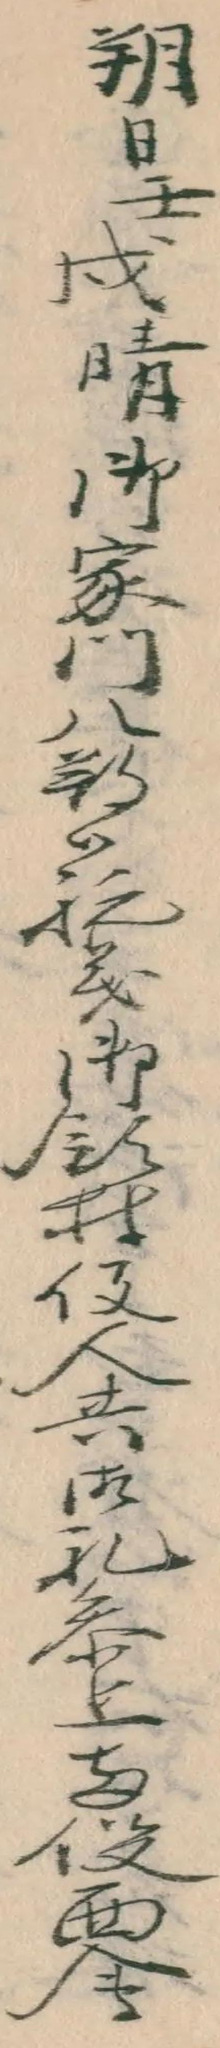朔日壬戌晴御家門八朔御祝義御領村役人共御礼参上両役面會
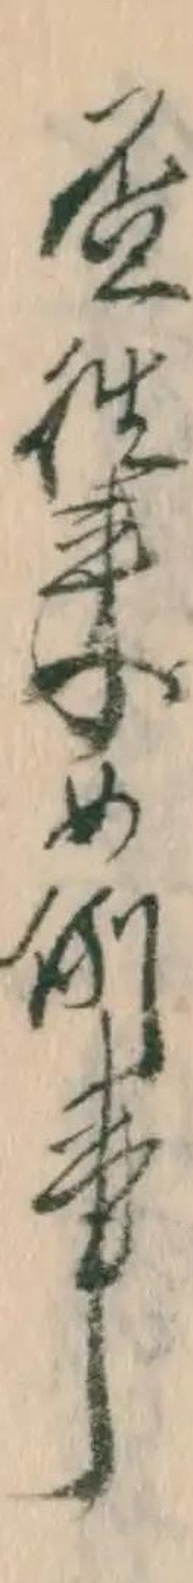盃往来如例事
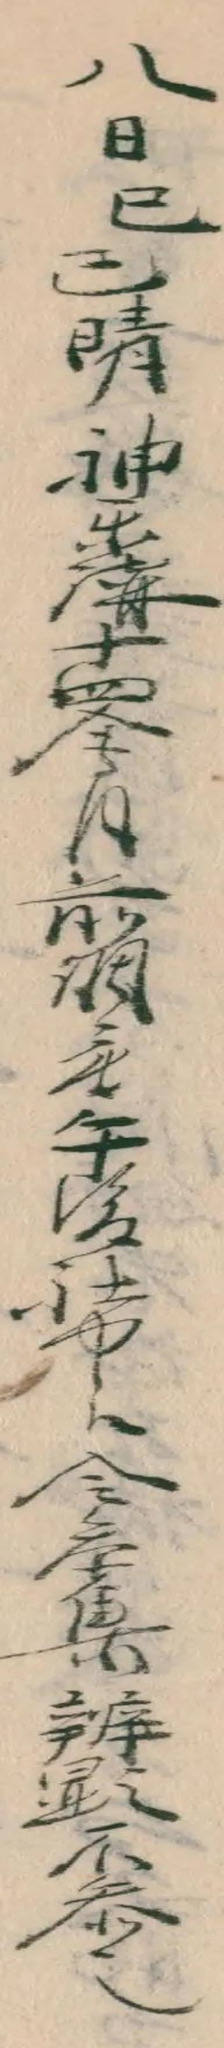八日己巳晴神楽講十四會目前調ニ付午後社中え令参集辨顕不参也
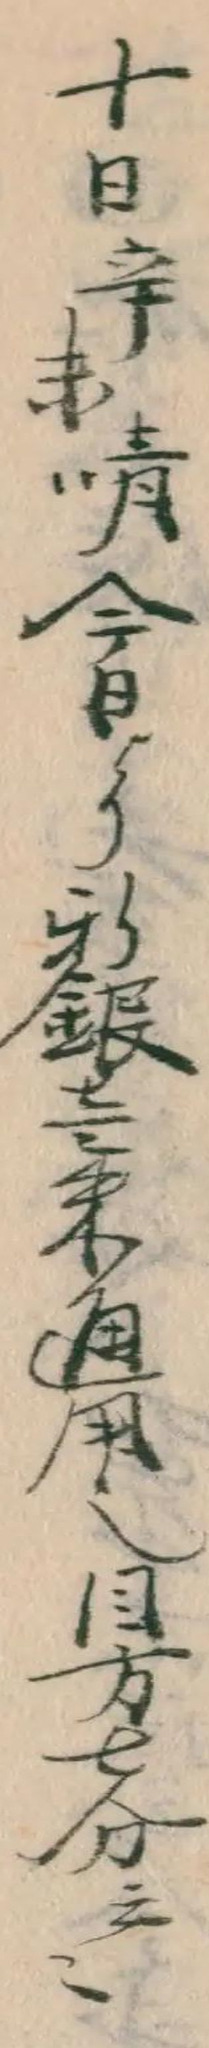十日辛未晴今日より新銀壱朱通用也目方七分云々
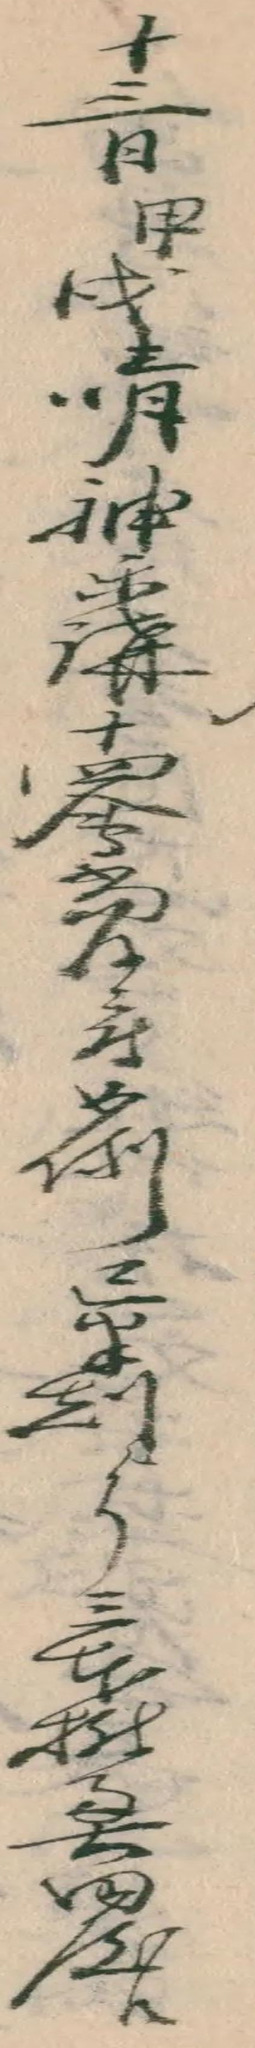十三日甲戌晴神楽講十四會當日ニ付如例巳半刻より三本掛奥田屋え
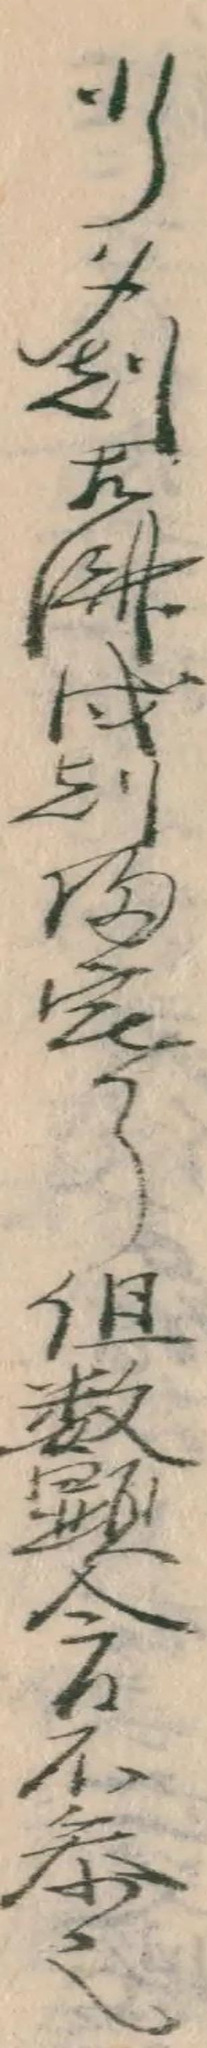行夕刻相済戌刻帰宅了但数顕今日不参也
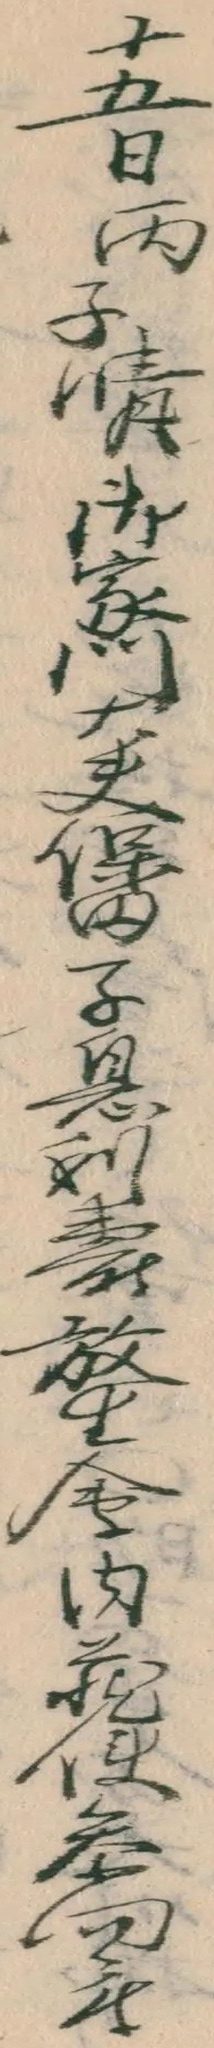十五日丙子晴御家門大夫保田子息利壽放生会内蔵使参向ニ付
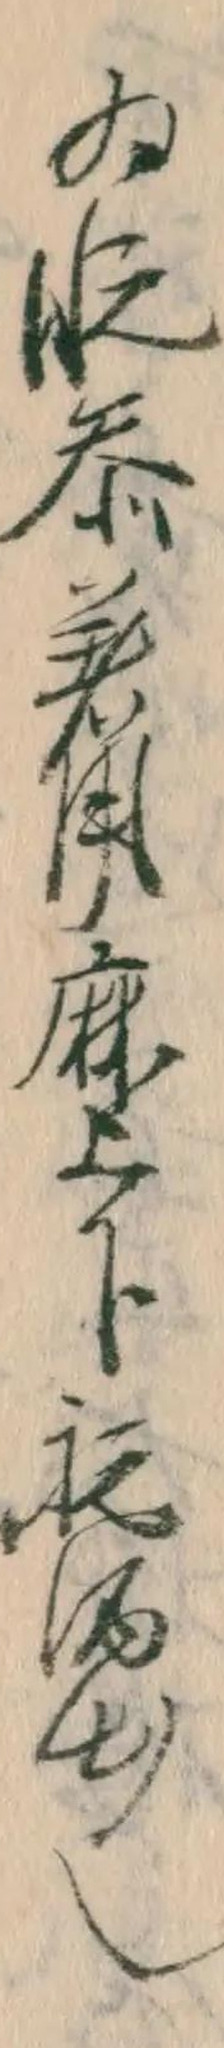為祝参着用麻上下祝酒出也
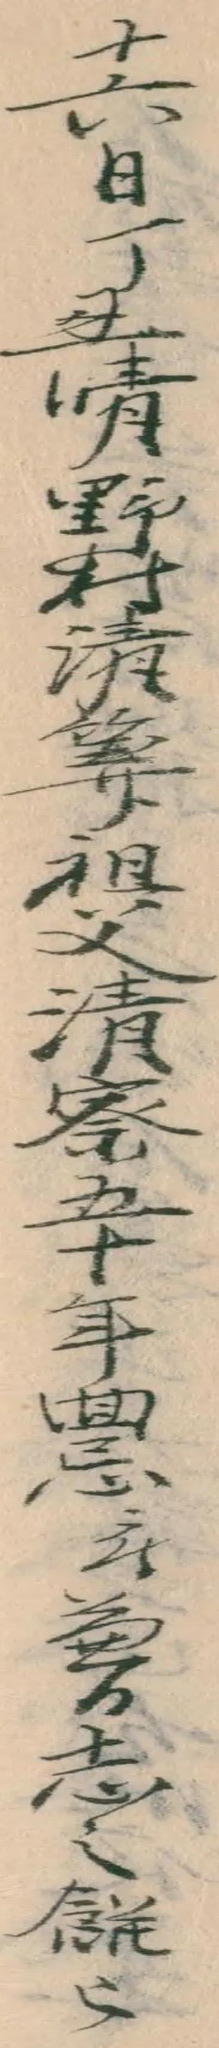十六日丁丑晴野村清筭祖父清察五十年回忌ニ付兼而志之餅被
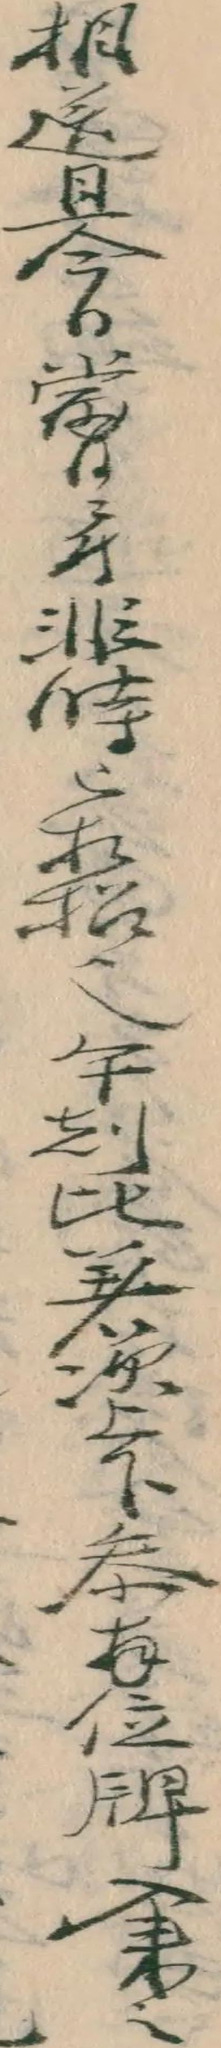相送且今日當日ニ付非時被相招也午刻比着次上下参拝位牌入来之
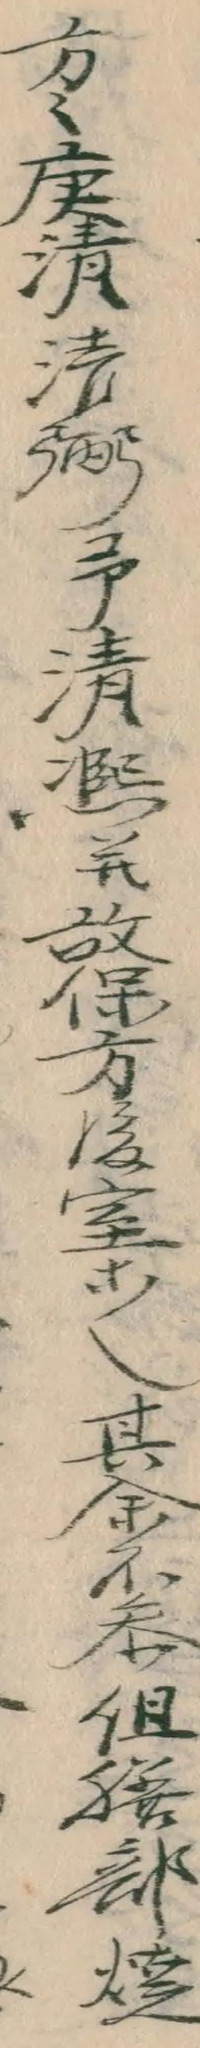方々庚清清弼予清煕并故保方後室等也其余不参但膳部焼
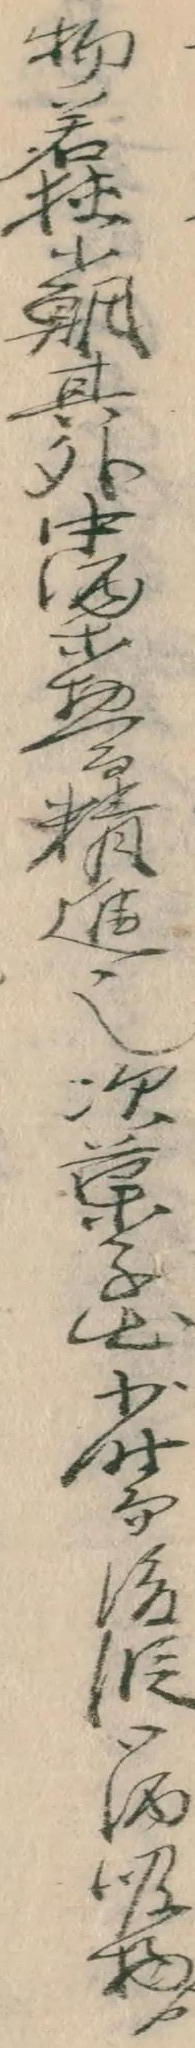物若狭小鯛其外中酒等惣而精進也次菓子出少時而後段御酒吸物ゟ
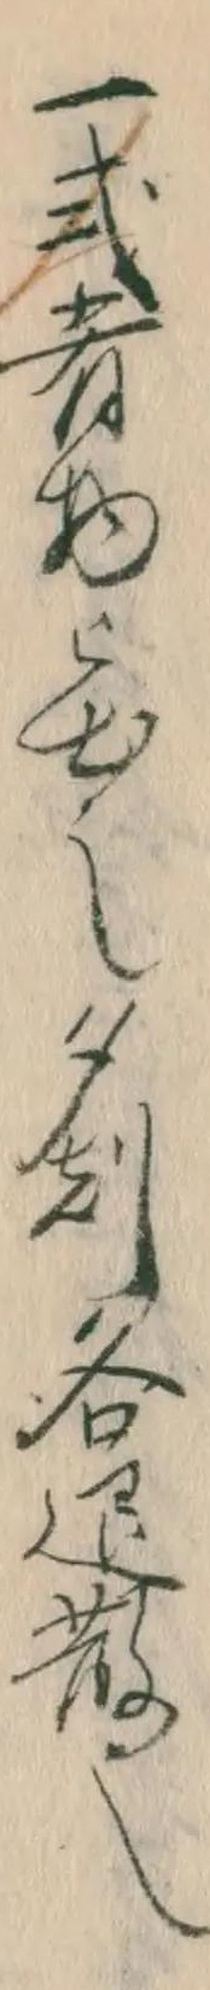一式肴物被出也夕刻各退散也
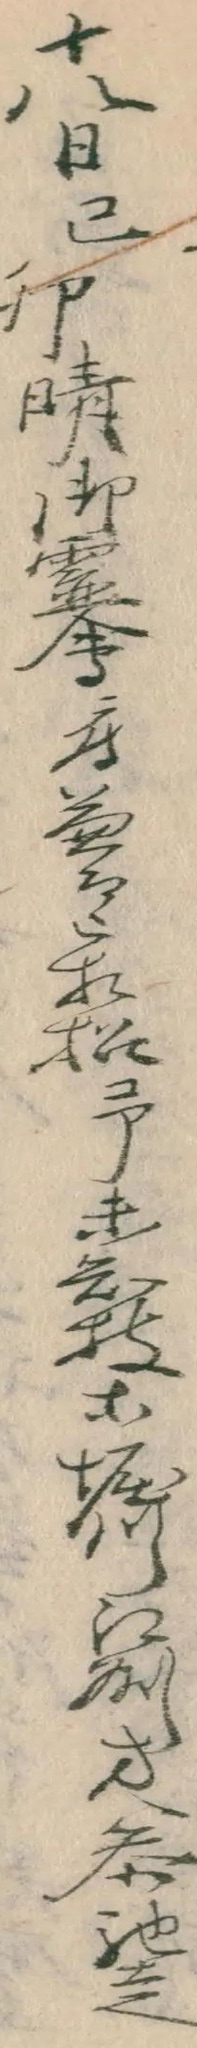十八日己卯晴御霊會ニ付兼而被相招予未知枝等堀川江州方へ参馳走
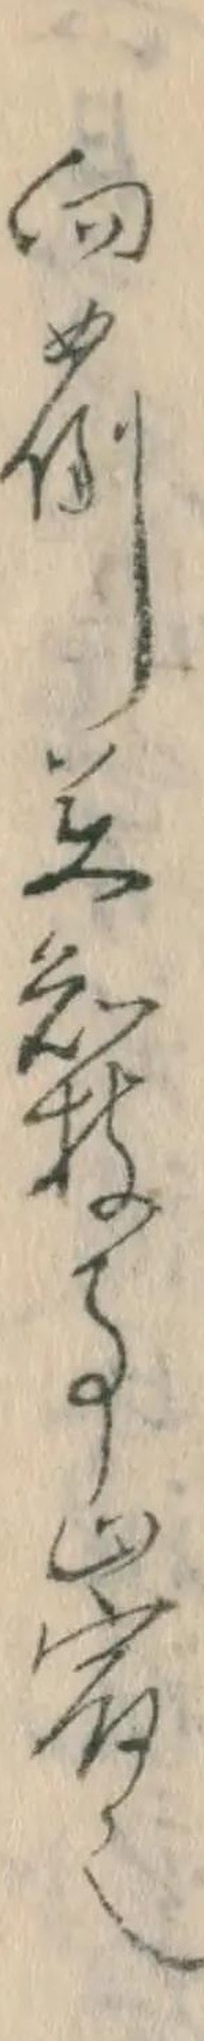向如例美知枝事止宿也
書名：賀茂社記録. 第65冊
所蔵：国立国会図書館 National Diet Library, JAPAN
